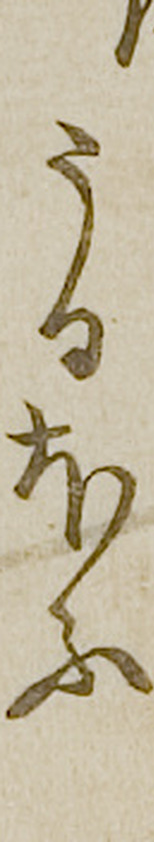うるほふ
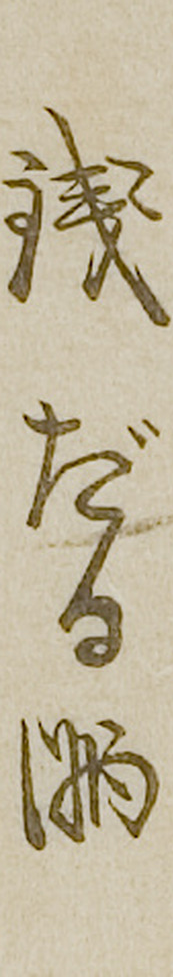銭だるま
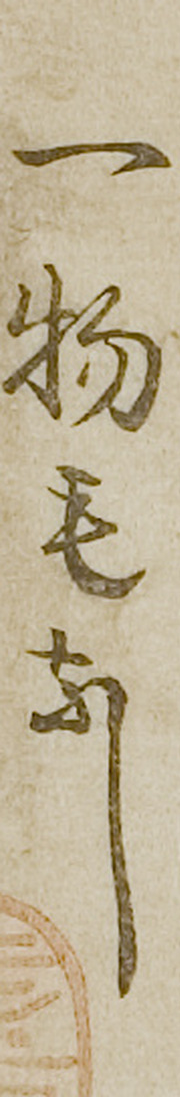一物もなし
